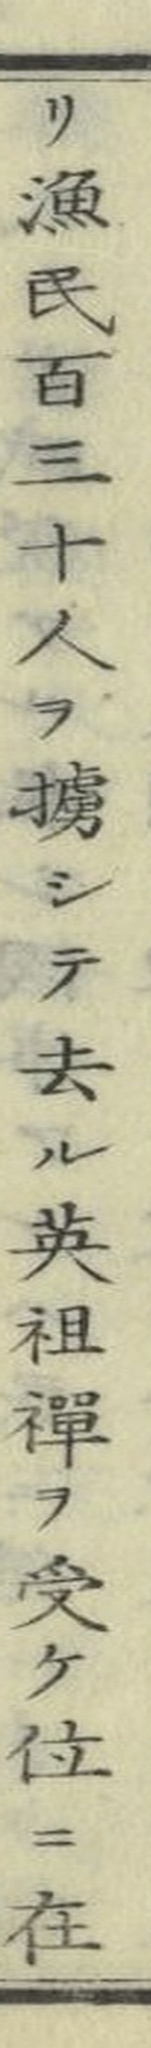リ漁民百三十人ヲ擄シテ去ル英祖禪ヲ受ケ位ニ在
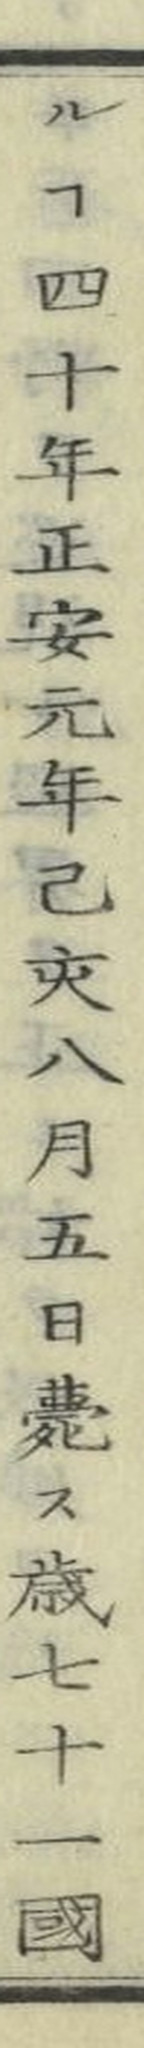ルコト四十年正安元年己亥八月五日薨ス歳七十一國
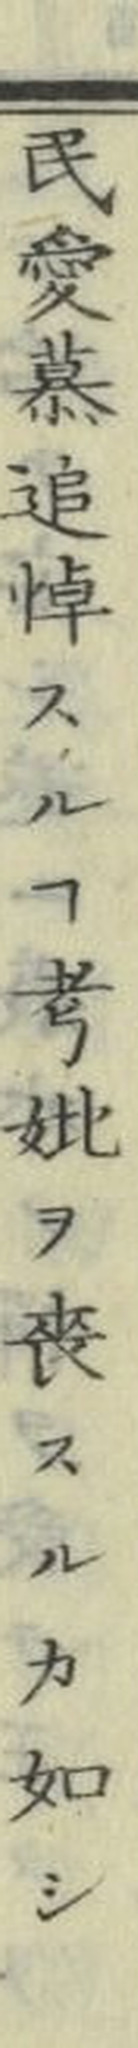民愛慕追悼スルコト考妣ヲスルカ如シ
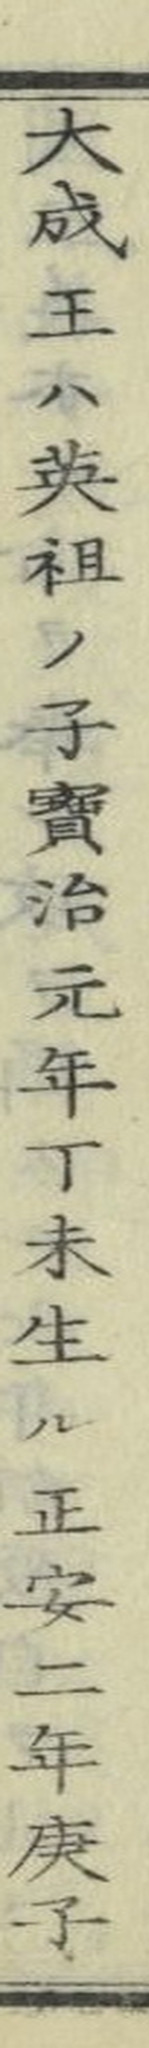大成王ハ英祖ノ子寶治元年丁未生ル正安二年庚子
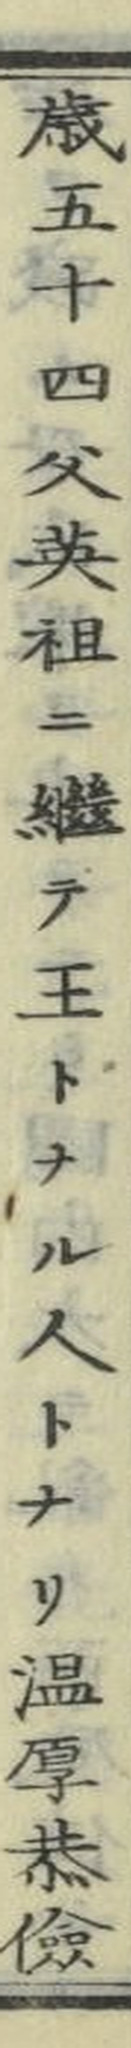歳五十四父英祖ニ繼テ王トナル人トナリ温厚恭儉
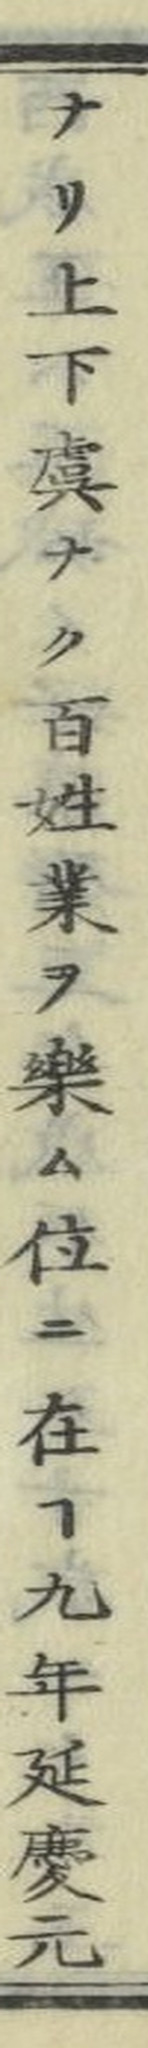ナリ上下虞ナク百姓業ヲ樂ム位ニ在コト九年延慶元
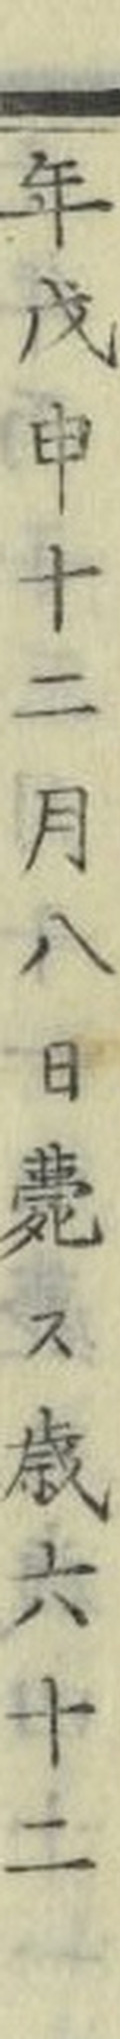年戊申十二月八日薨ス歳六十二
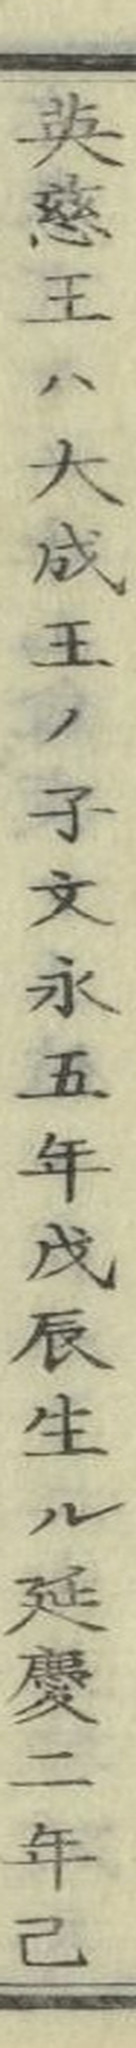英慈王ハ大成王ノ子文永五年戊辰生ル延慶二年己
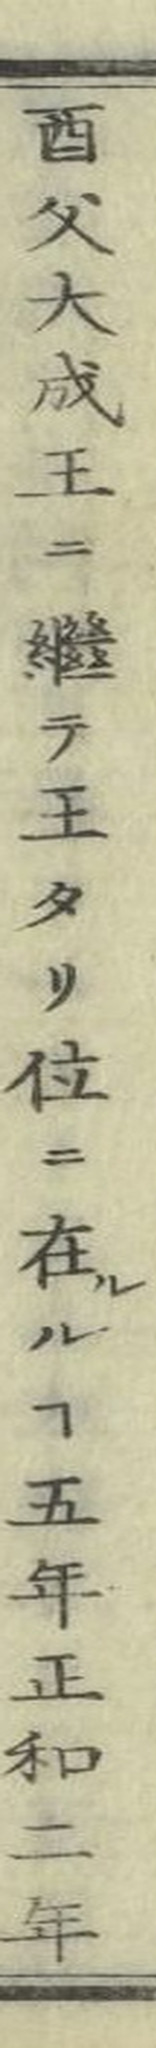酉父大成王ニ繼テ王タリ位ニ在ルコト五年正和二年
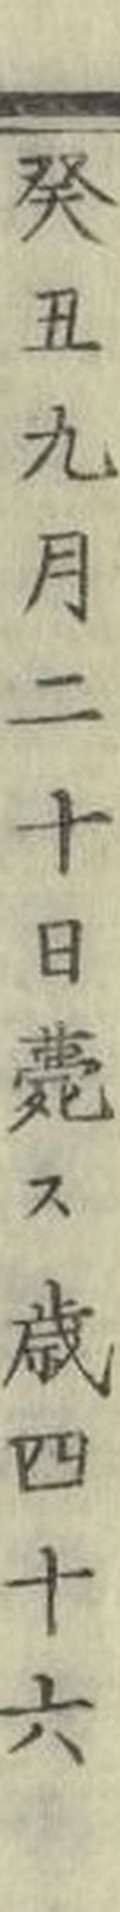癸丑九月二十日薨ス歳四十六
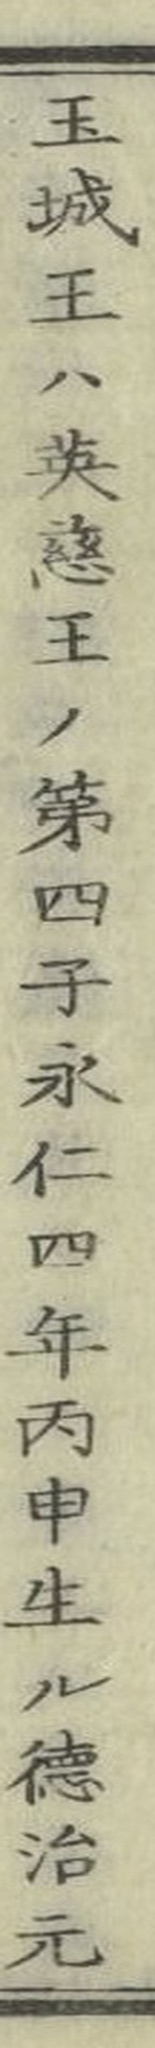玉城王ハ英慈王ノ第四子永仁四年丙申生ル德治元
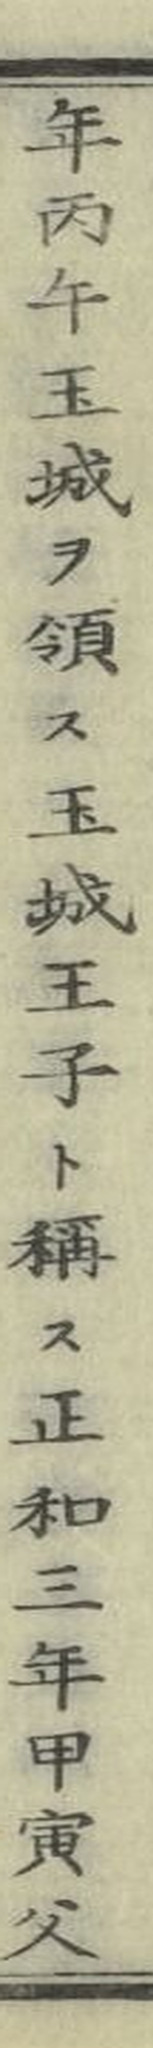年丙午玉城ヲ領ス玉城王子ト稱ス正和三年甲寅父
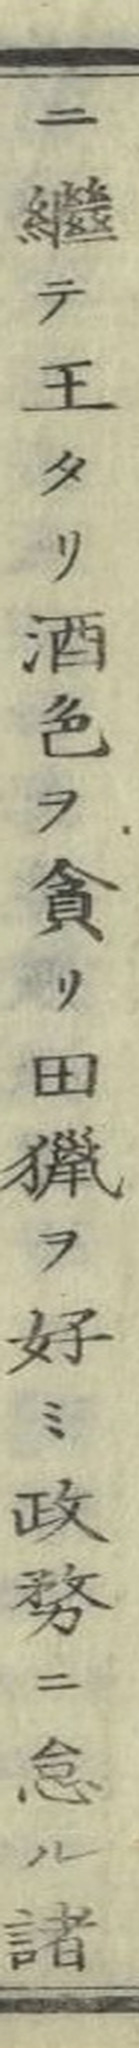ニ繼テ王タリ酒色ヲ貪リ田猟ヲ好ミ政務ニ怠ル諸
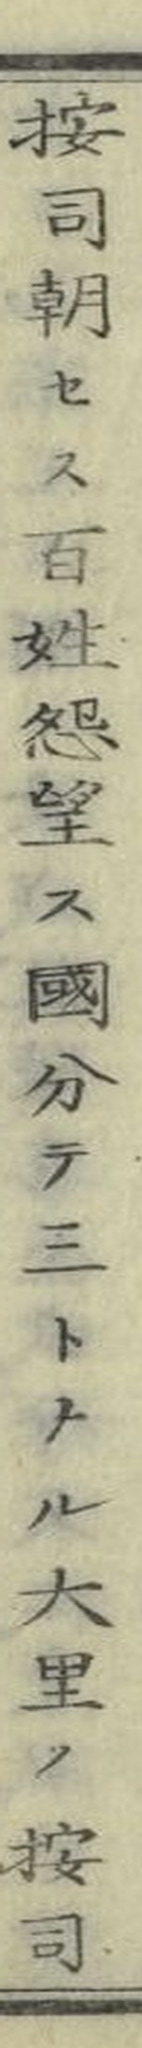按司朝セス百姓怨望ス國分テ三トナル大里ノ按司

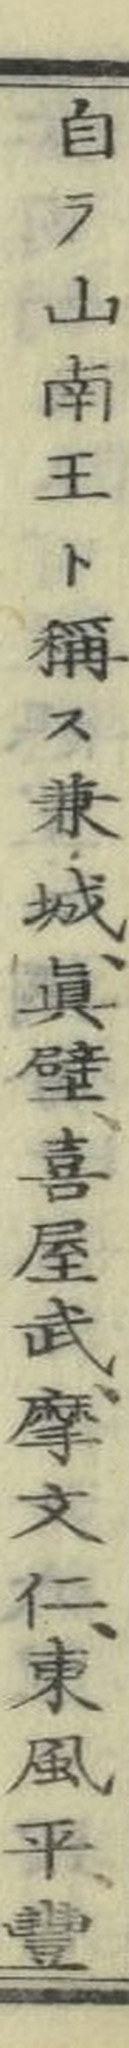自ラ山南王ト稱ス兼城、眞壁、喜屋武、摩文仁、東風平、豐
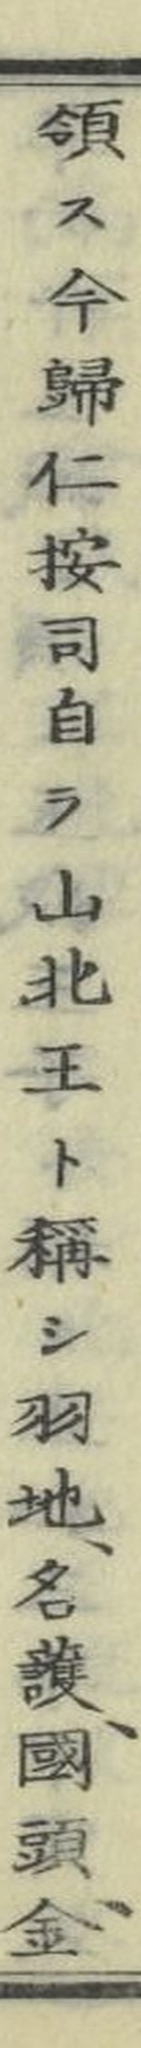領ス今帰仁按司自ラ山北王卜稱シ羽地、名護、國頭、金
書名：琉球藩史 一之巻
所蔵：University of the Ryukyus Library
